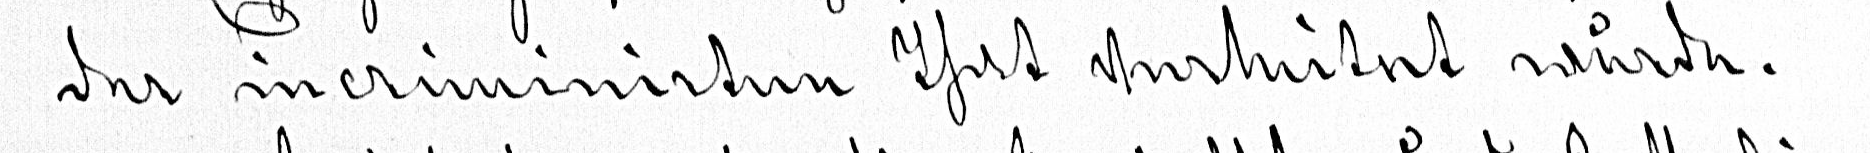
der incriminirten That verleitet wurde.
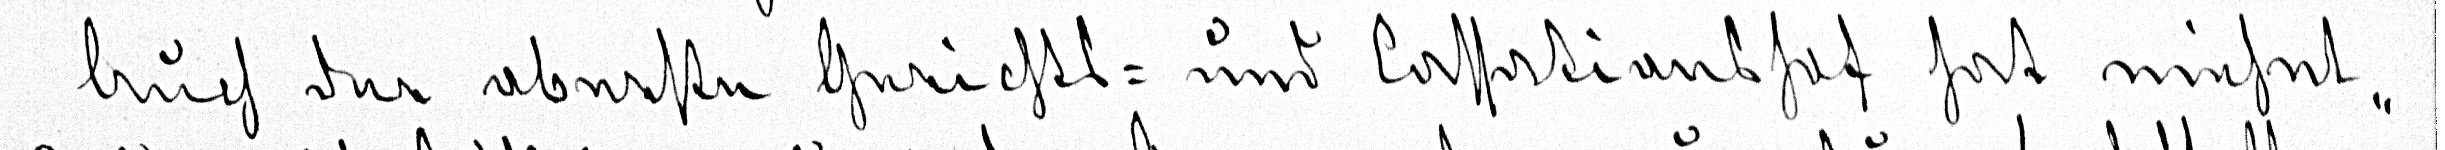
Auch der oberste Gerichts- und Cassationshof hat einhel¬
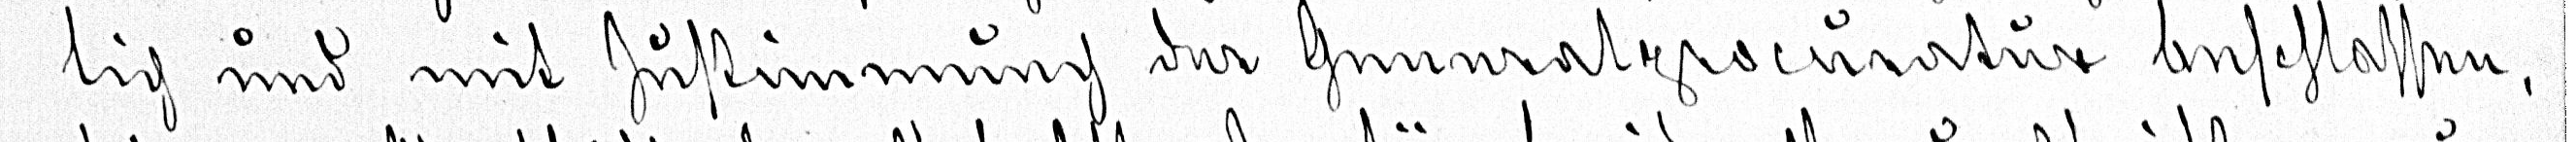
lig und mit Zustimmung der Generalprocuratur beschlossen,
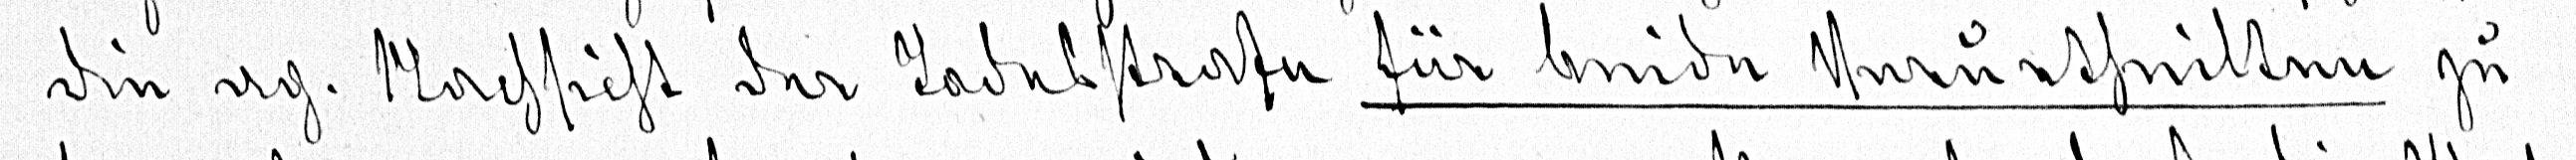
die ag. Nachsicht der Todesstrafe für beide Verurtheilten zu
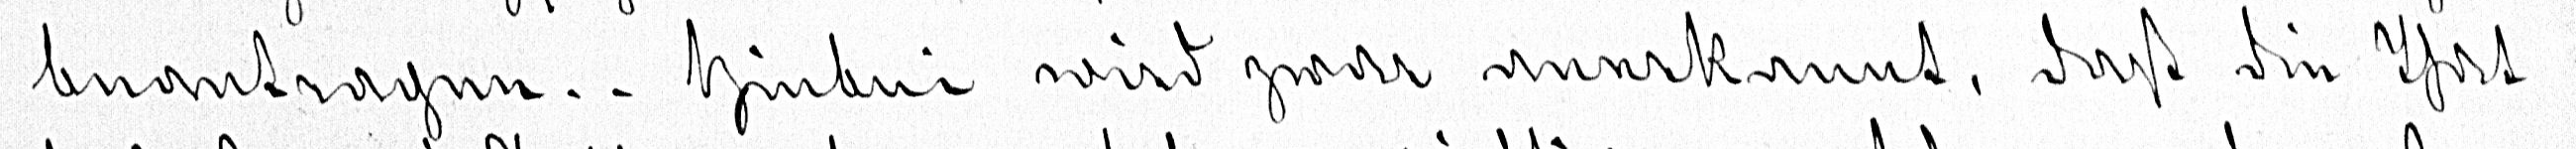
beantragen.- Hiebei wird zwar anerkannt, daß die That
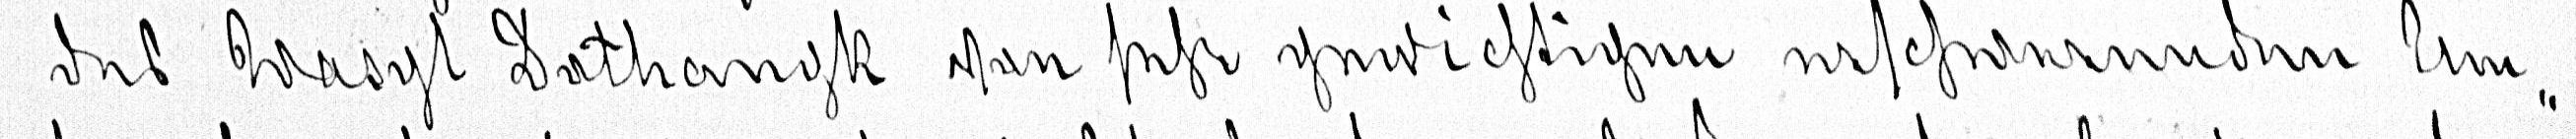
des Wasyl Dothanyk von sehe gewichtigen erschwerenden Um¬
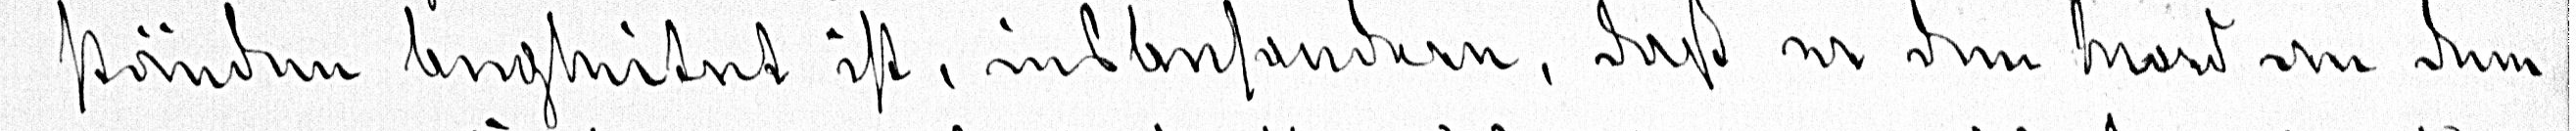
ständen begleitet ist, insbesondern, daß er dem Mord an dem
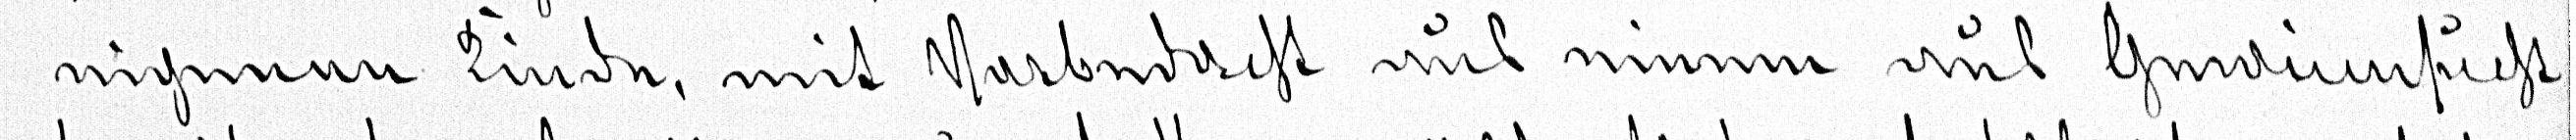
eigenen Kinde, mit Vorbedacht aus einem aus Gewinnsucht
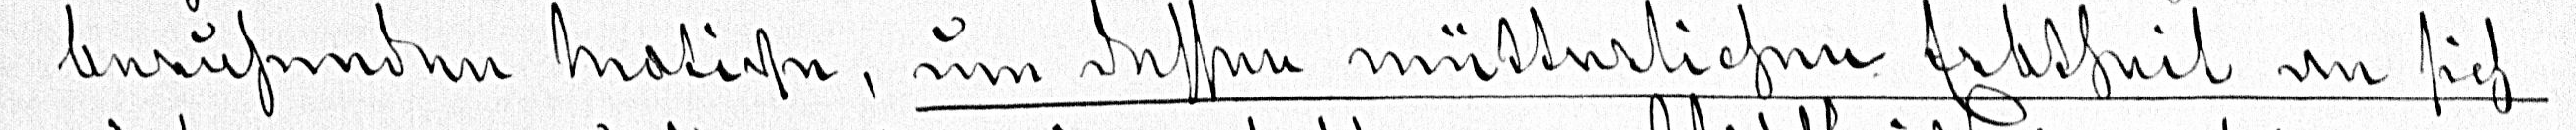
berufenden Motive, um dessen mütterlichen Erbtheil an sich
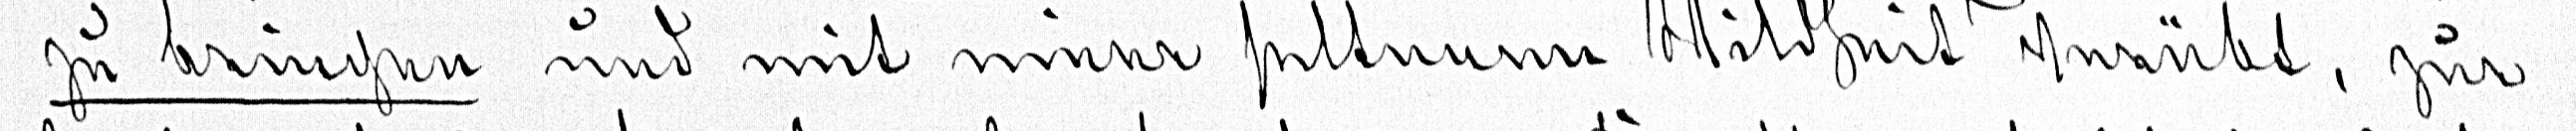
zu bringen und mit einer seltenen Wildheit verübt, zur
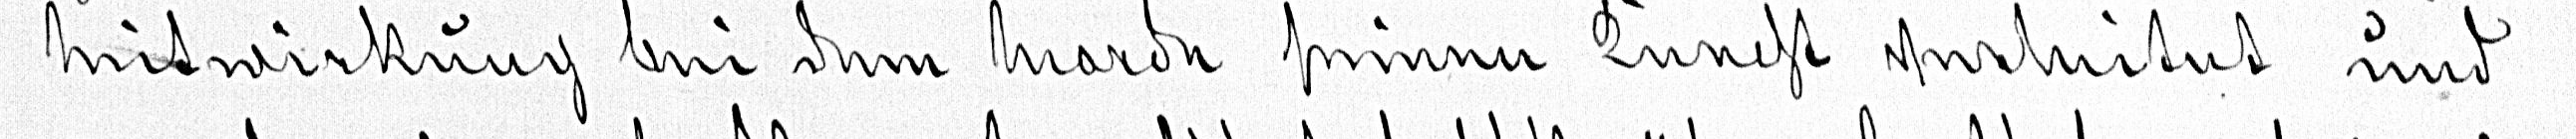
Mitwirkung bei dem Morde seinen Knecht verleitet und
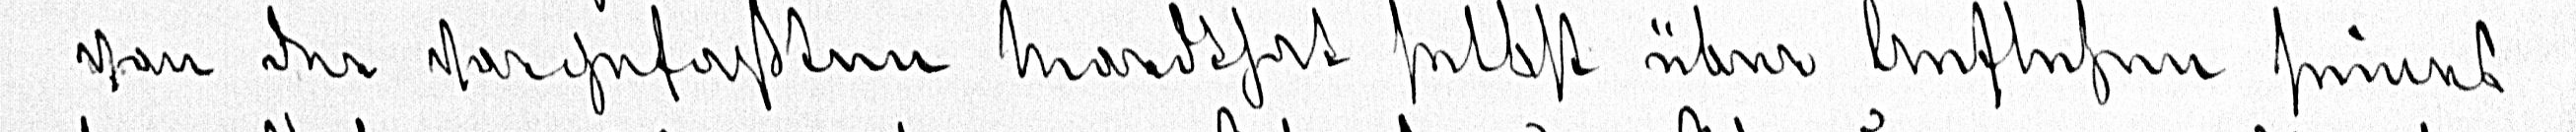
von der vorgefaßten Mordthat selbst über Anflehen seines
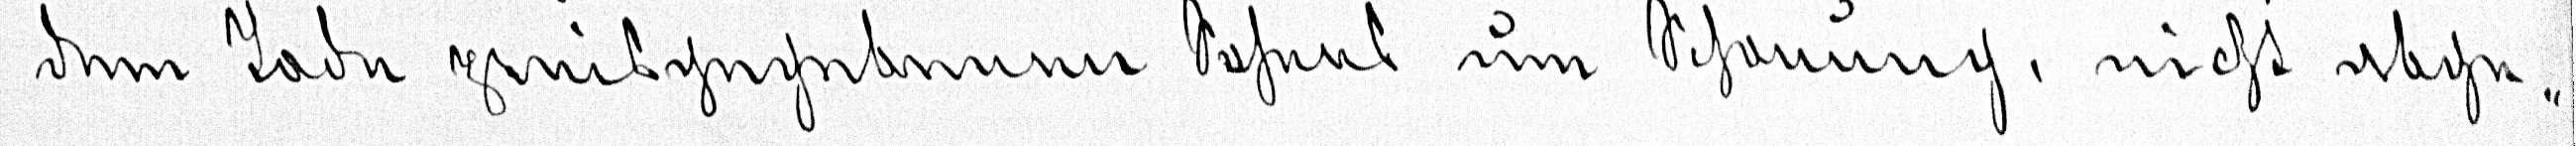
dem Tode preisgegebenen Sohnes um Schonung, nicht abge¬
